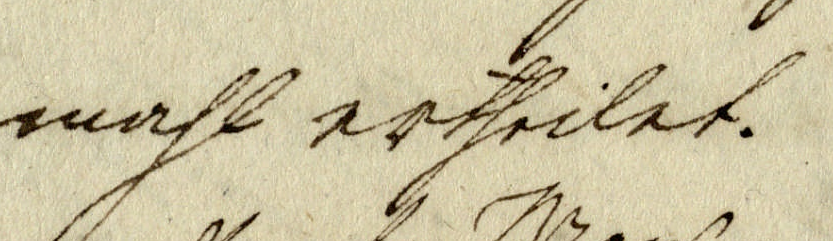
mahl ertheilet.
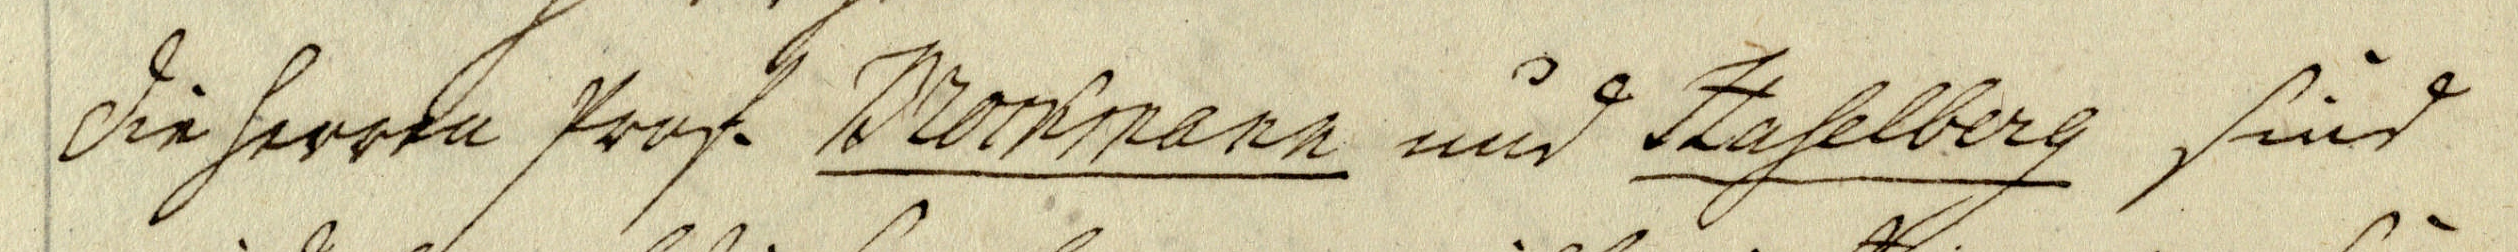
Die Herren Prof. Brockmann und Haselberg sind
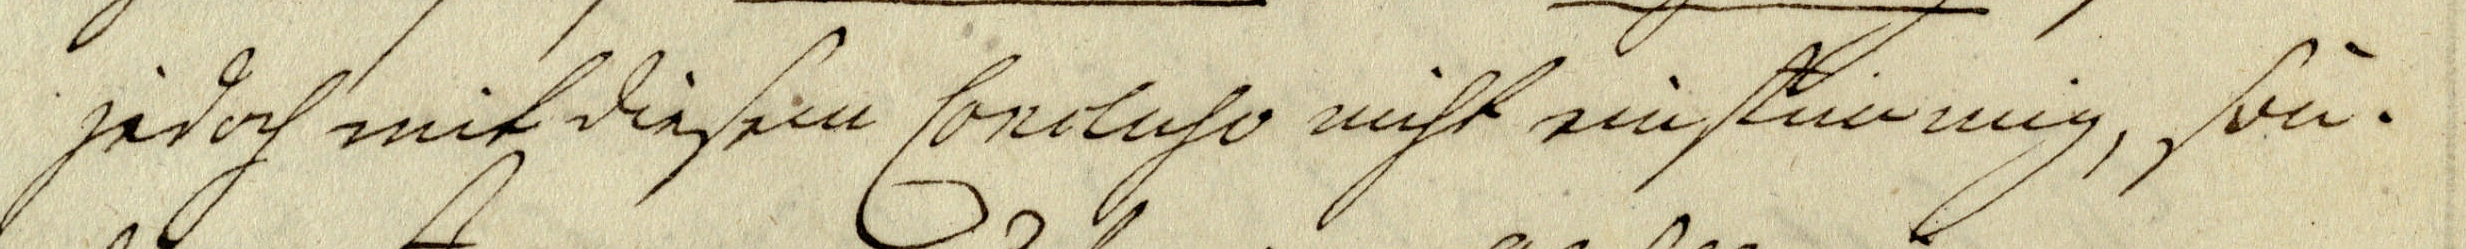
jedoch mit diesem Concluso nicht einstimmig, son¬
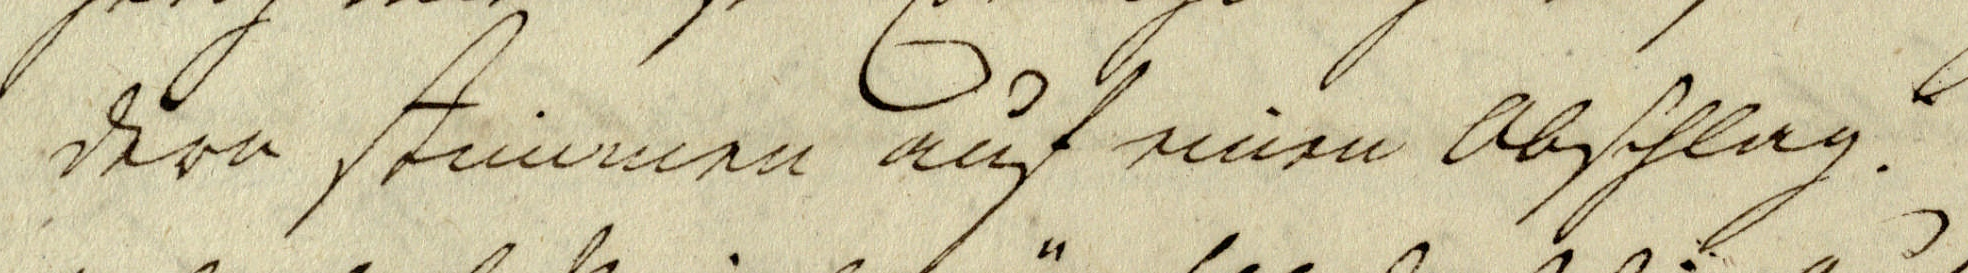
dern stimmen auf ein Abschlag.
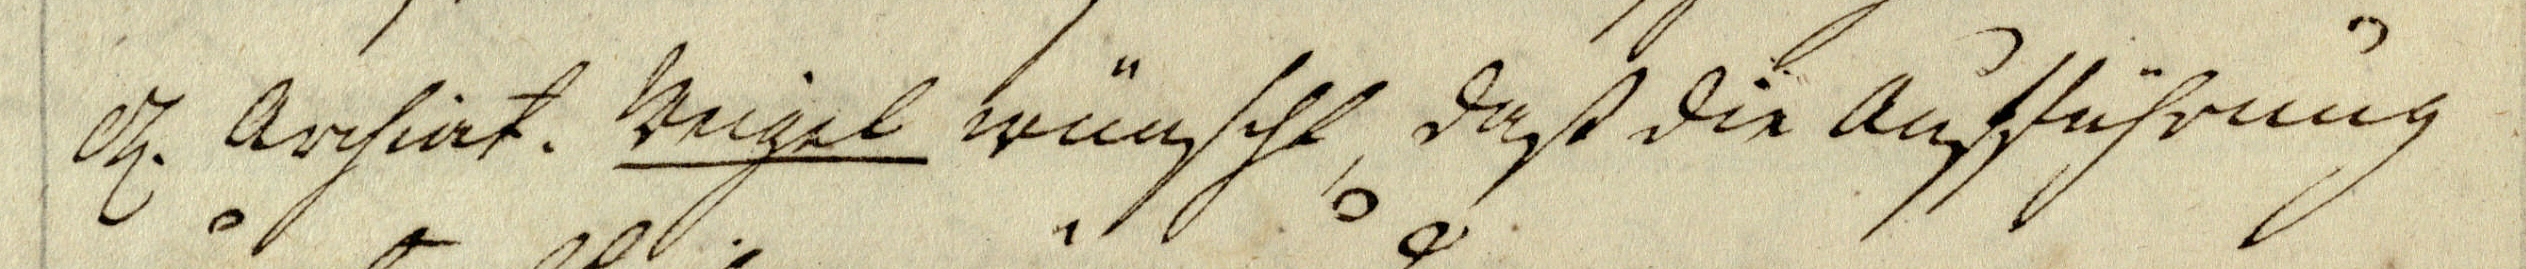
dh. Archiat. Weigel wünscht, daß die Aufführung
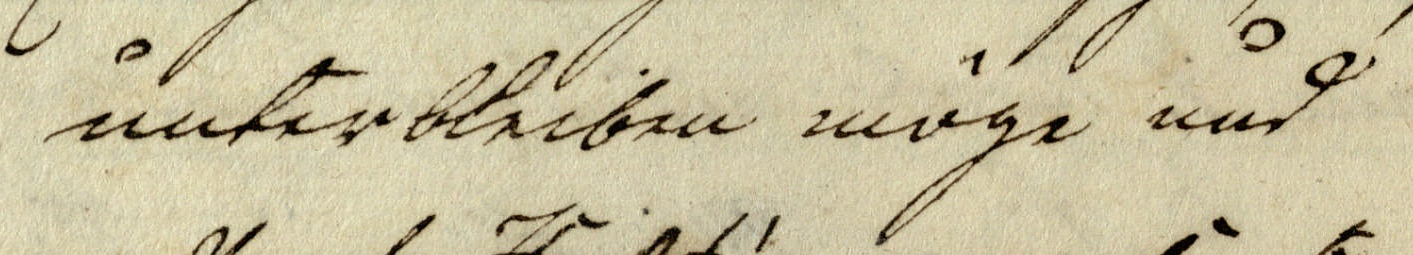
unterbleiben möge und
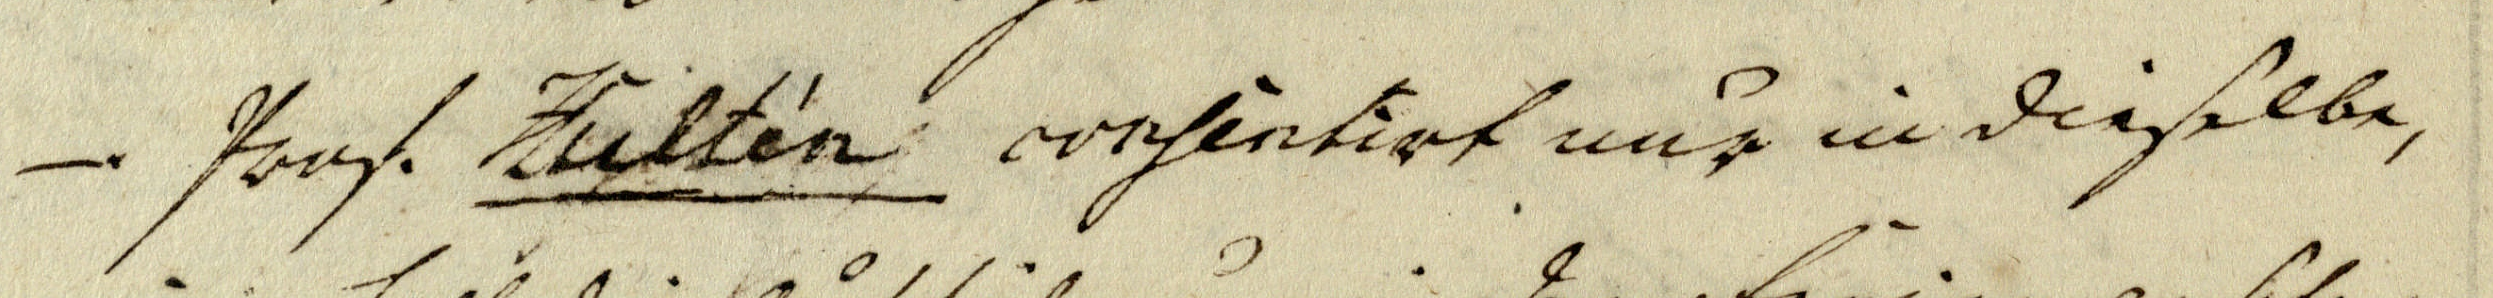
Prof. Hultén consentirt nur in dieselbe,
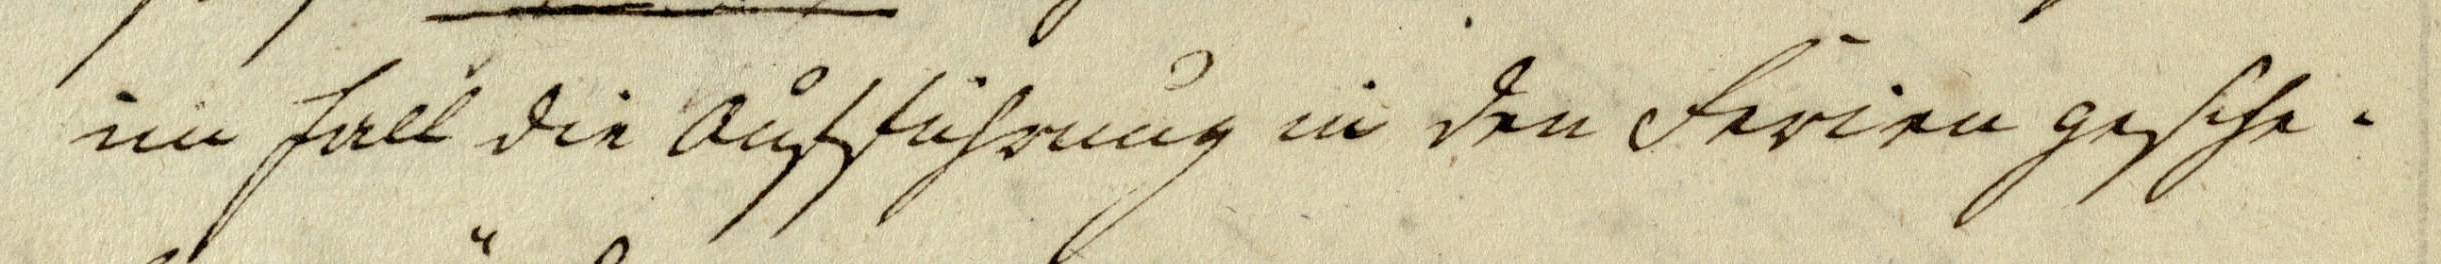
im Fall die Aufführung in den Ferien gesche¬
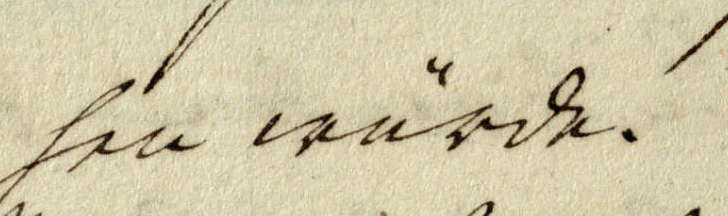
hen würde.
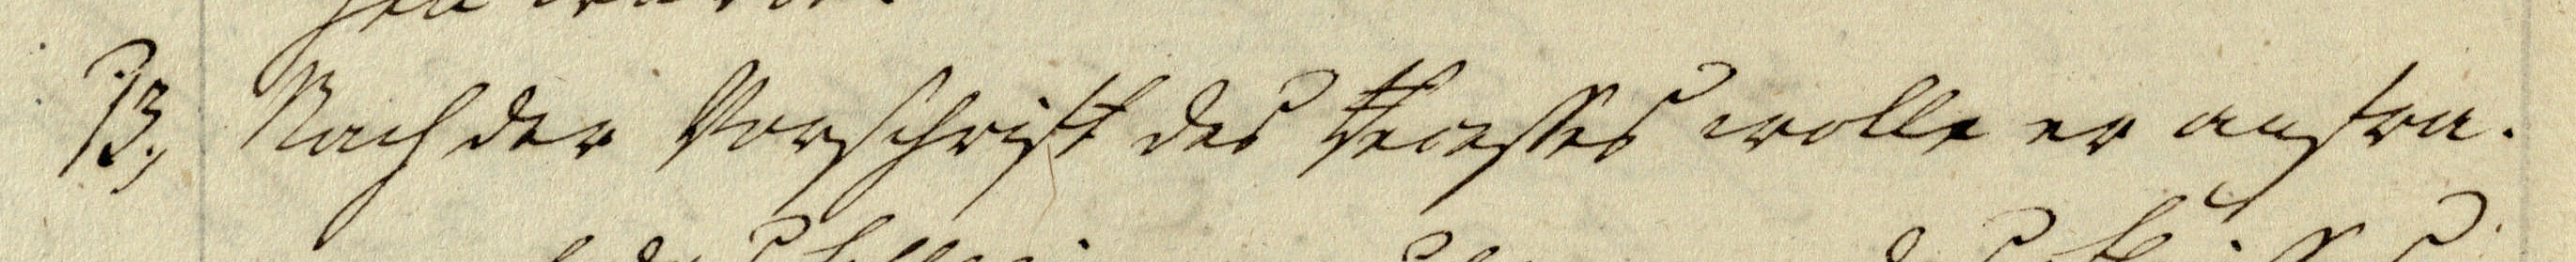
13., Nach der Vorschrift des Recesses wolle er anfra¬
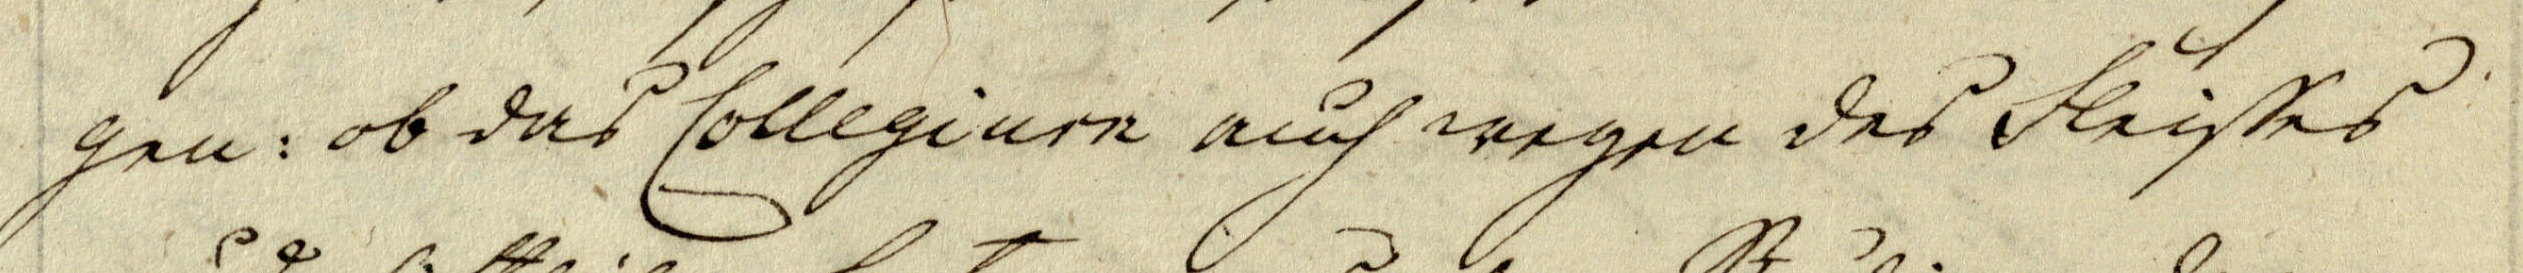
gen: ob das Collegium auch wegen des Fleisses
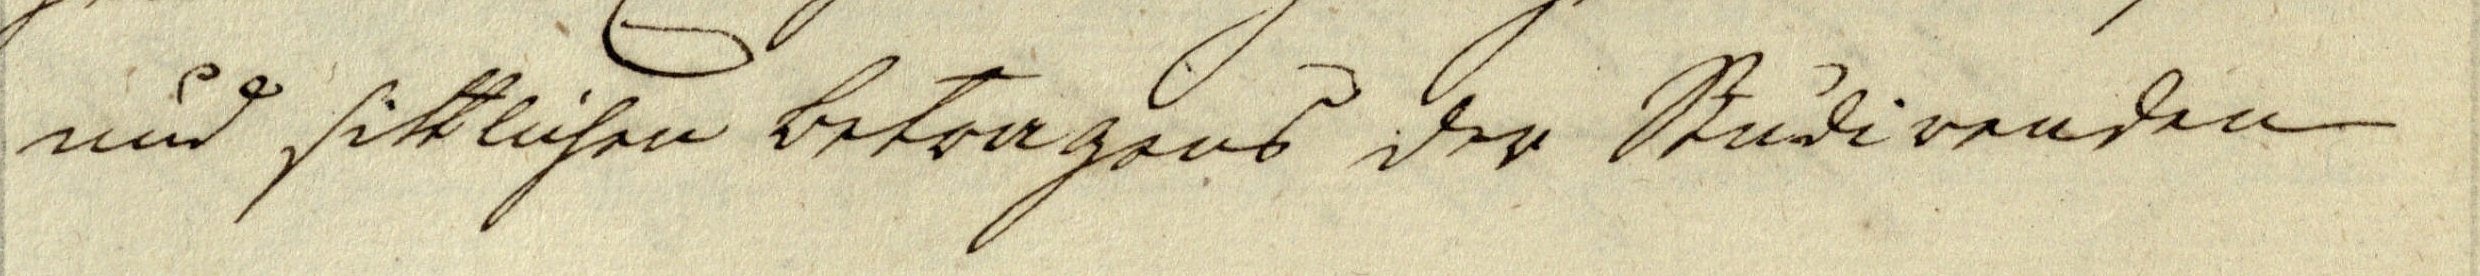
und sittlichen Betragens der Studirenden
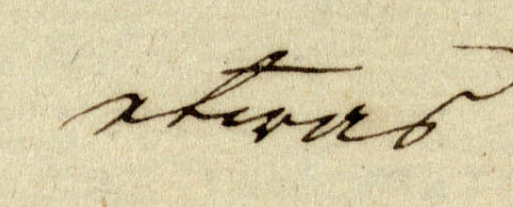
etwas
